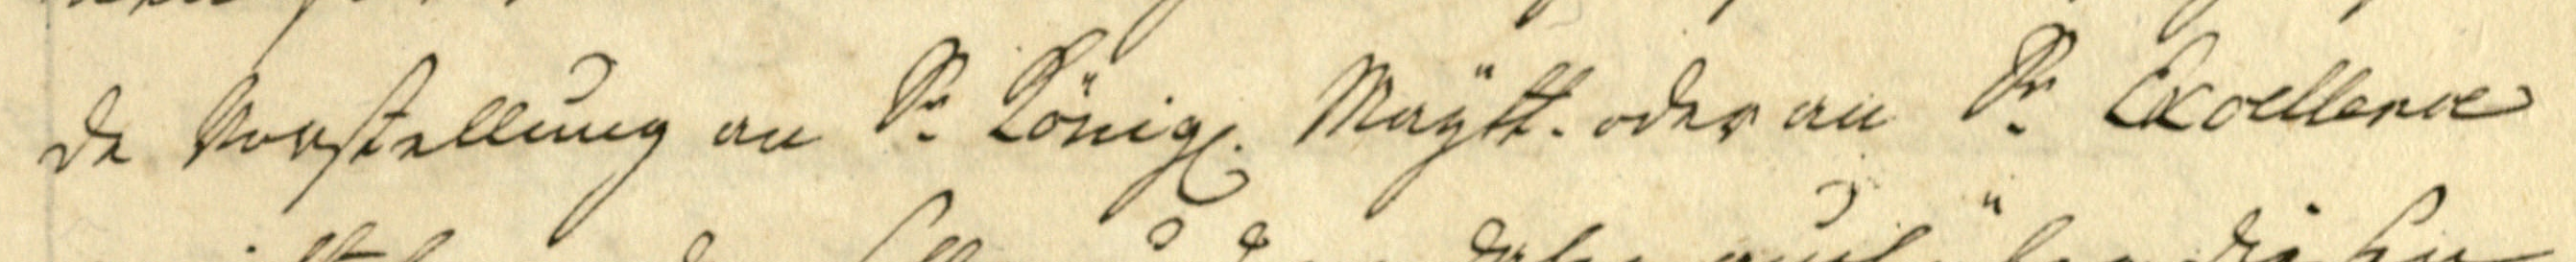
de Vorstellung an Sr. Königl. Maÿtt. oder an Sr Excellence
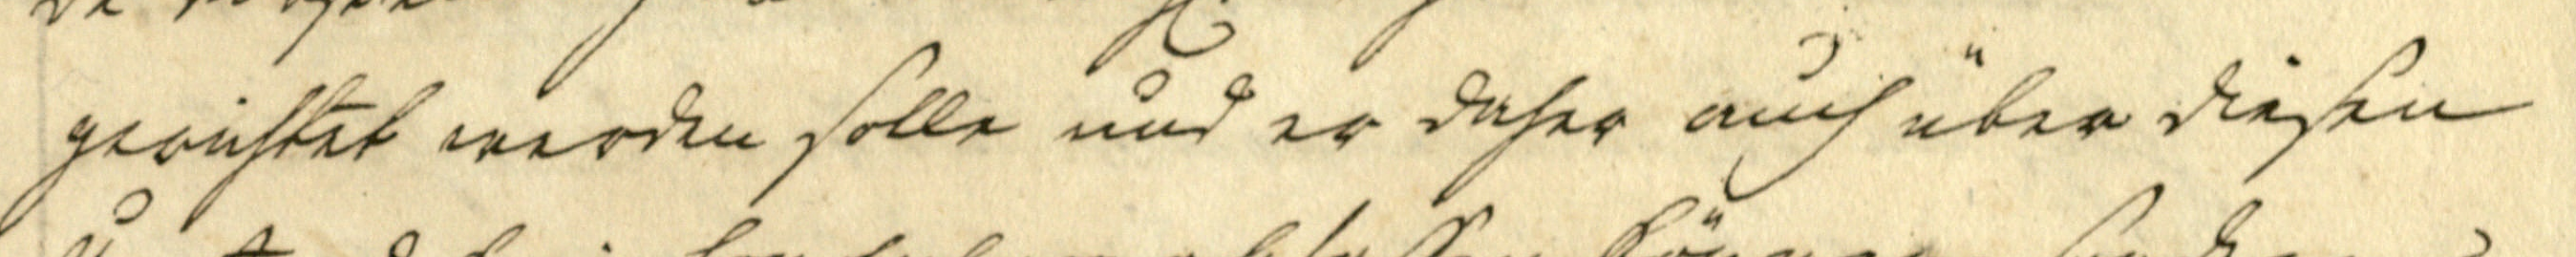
gerichtet werden solle und er daher auch über diesen
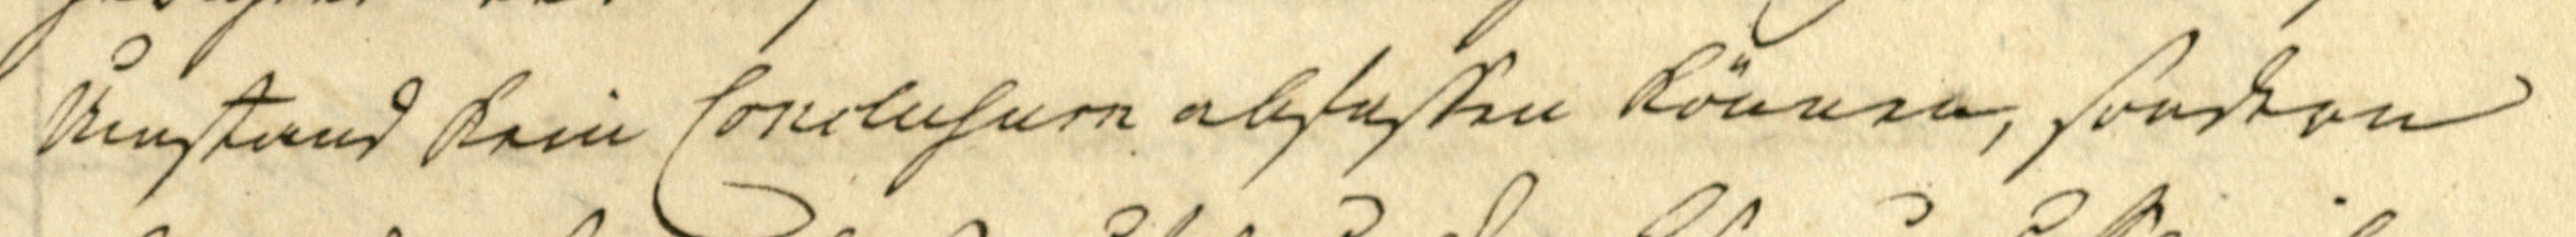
Umstand kein Conclusum abfassen können, sondern
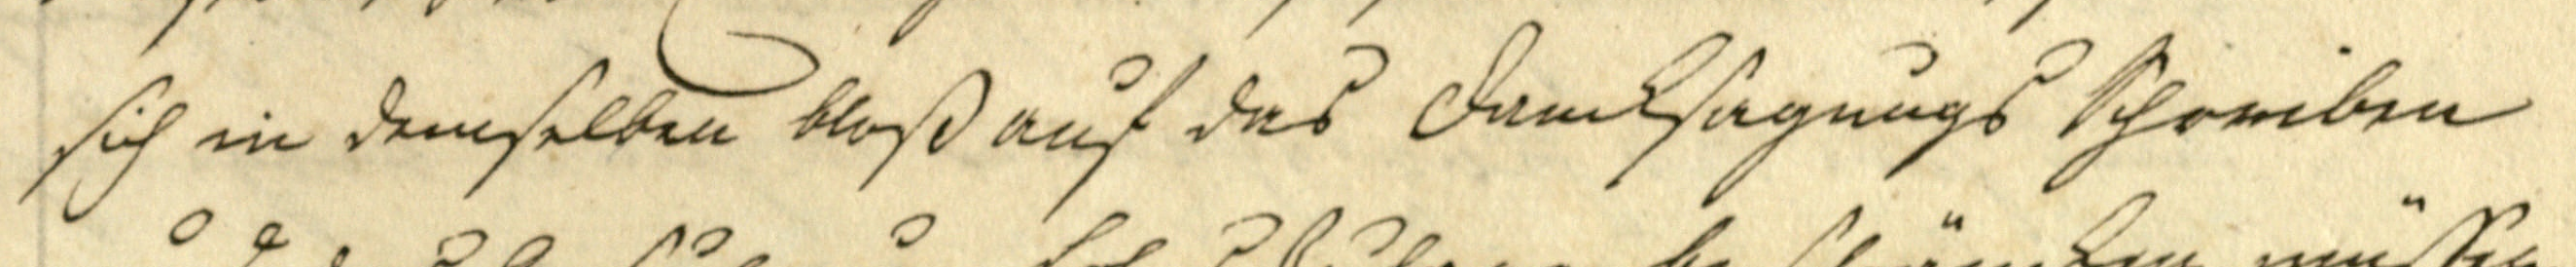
sich in demselben bloß auf das Dancksagungs Schreiben
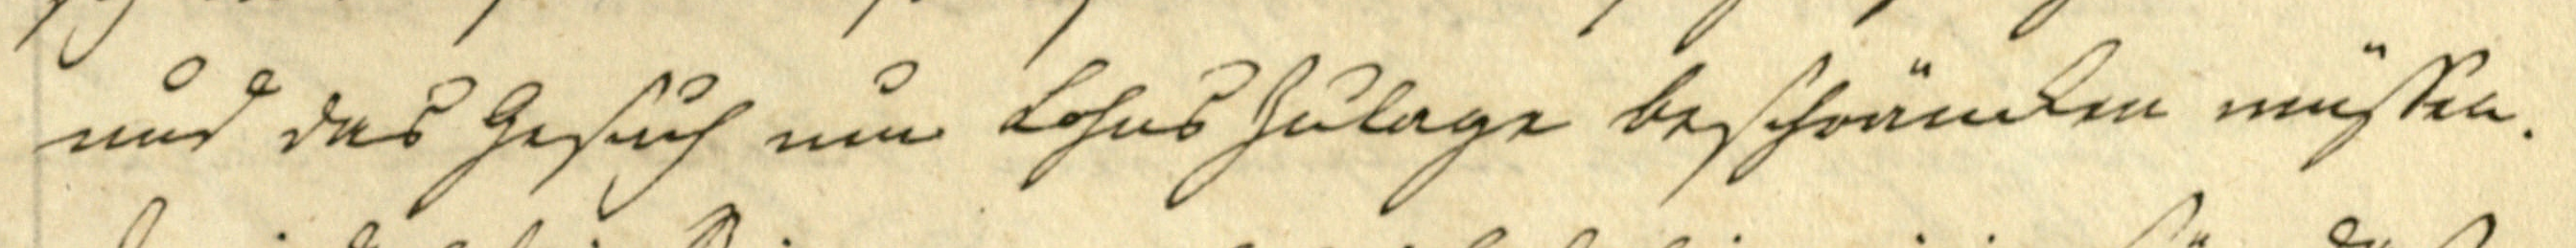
und das Gesuch um Lohns Zulage beschräncken müssen.
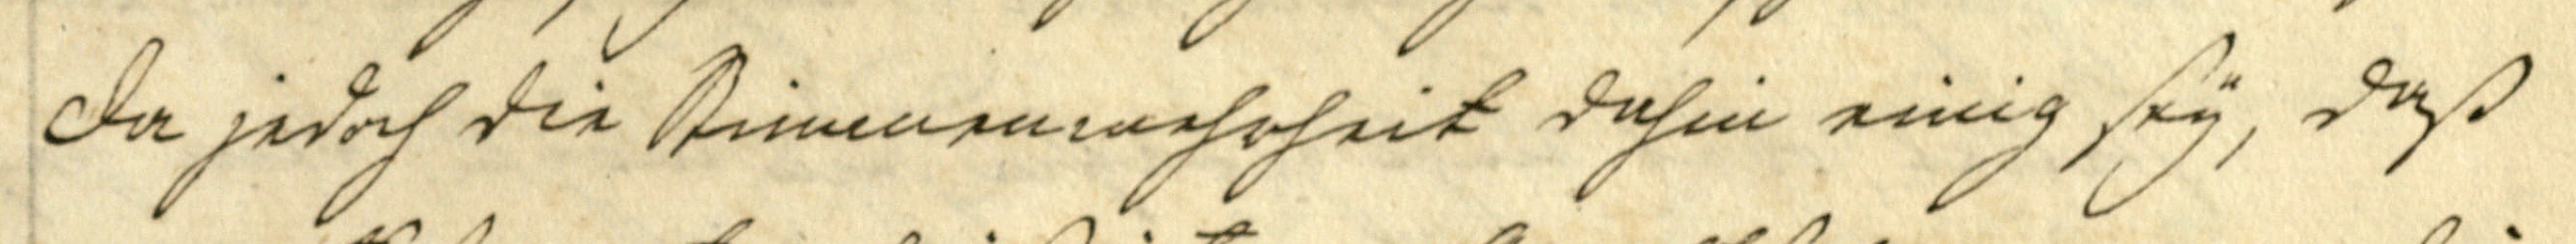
Da jedoch die Stimmenmehrheit dahin einig seÿ, daß
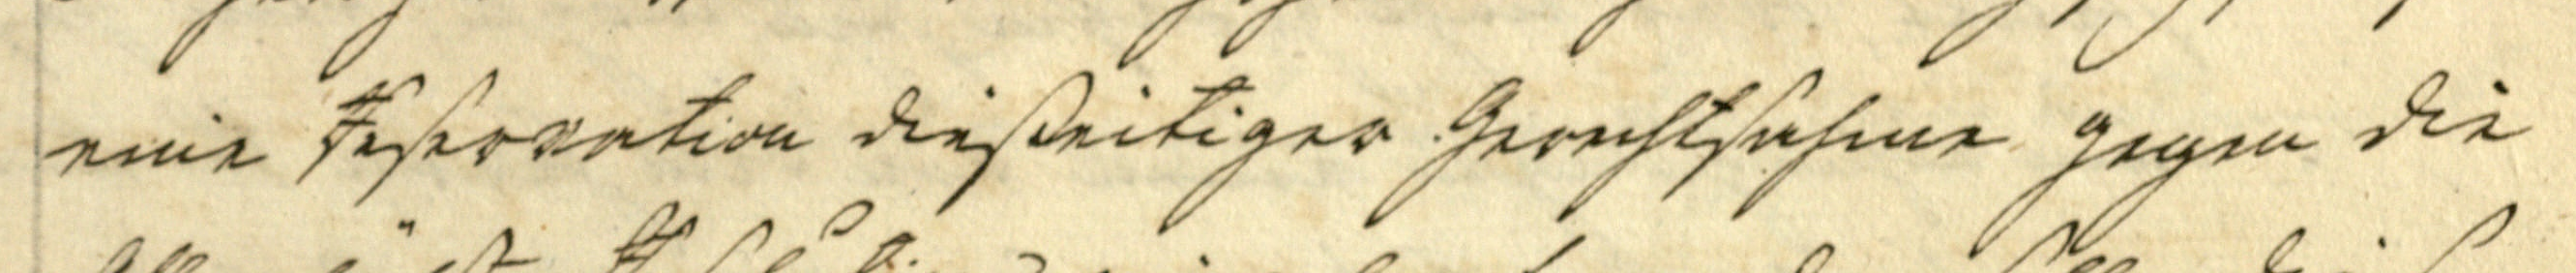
eine Reservation diesseitiger Gerechtsahme gegen die
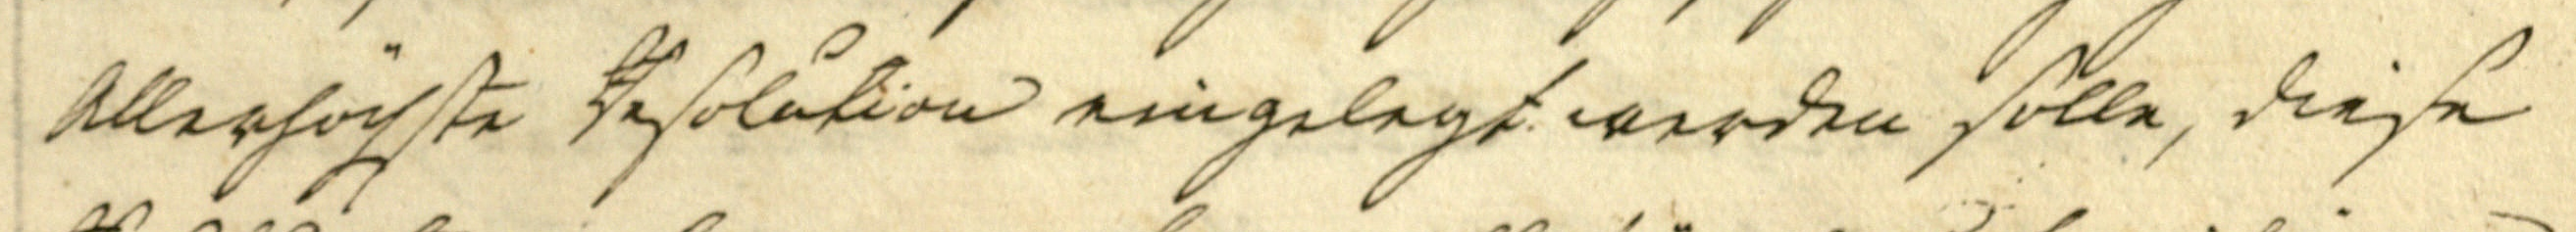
Allerhöchste Resolution eingelegt werden solle, diese
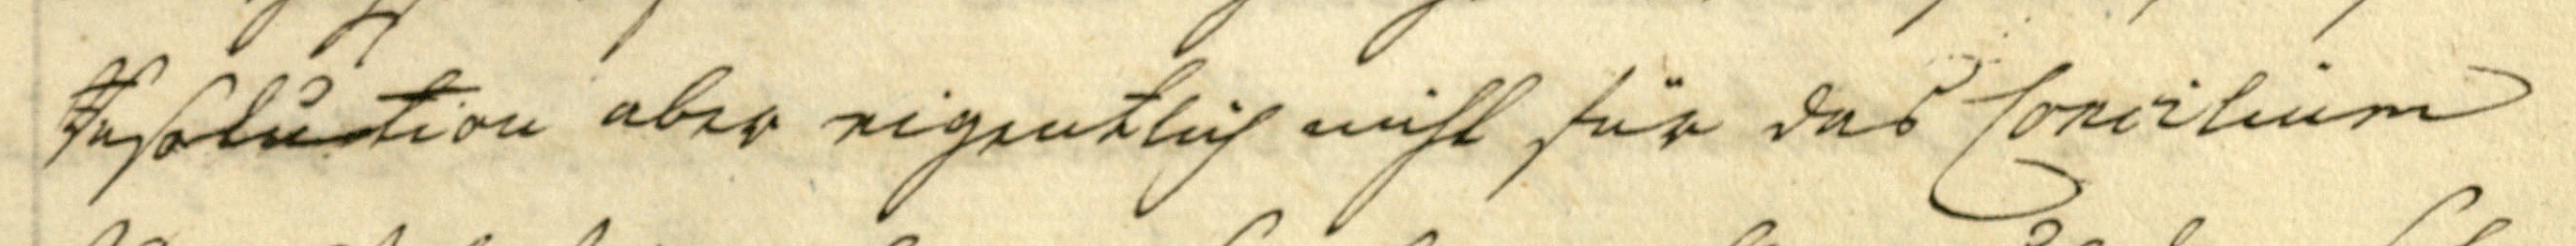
Resolution aber eigentlich nicht für das Concilium
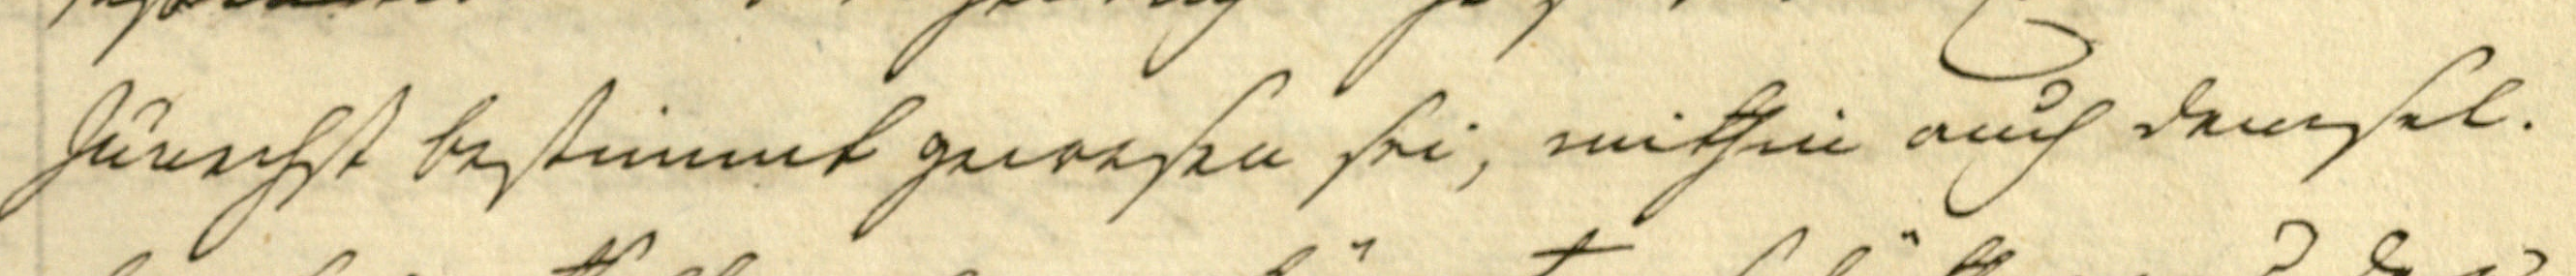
zunechst bestimmt gewesen sei, mithin auch demsel¬
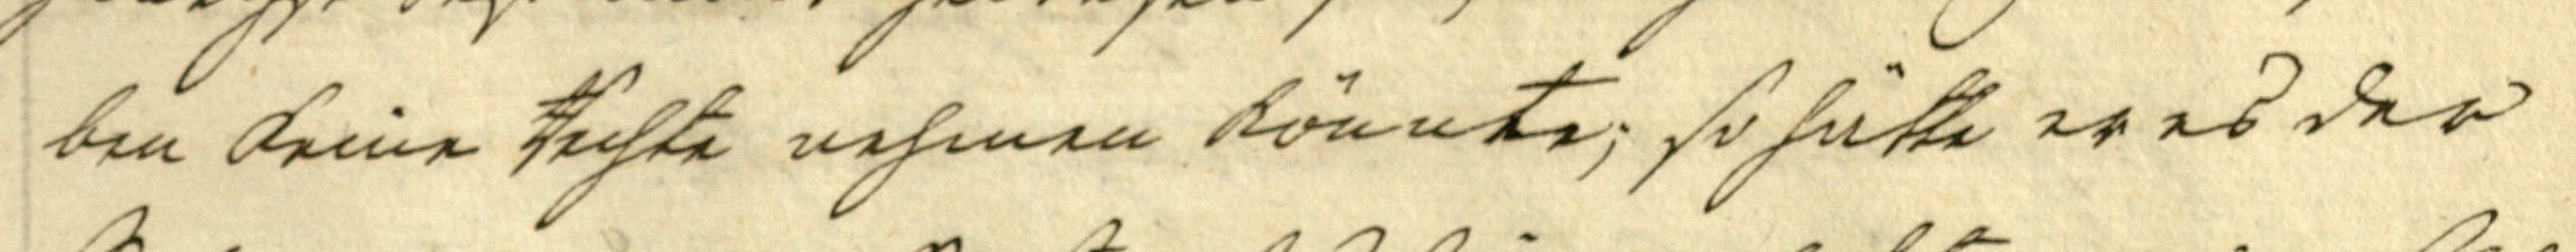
ben keine Rechte nehmen könnte, so hätte er es der
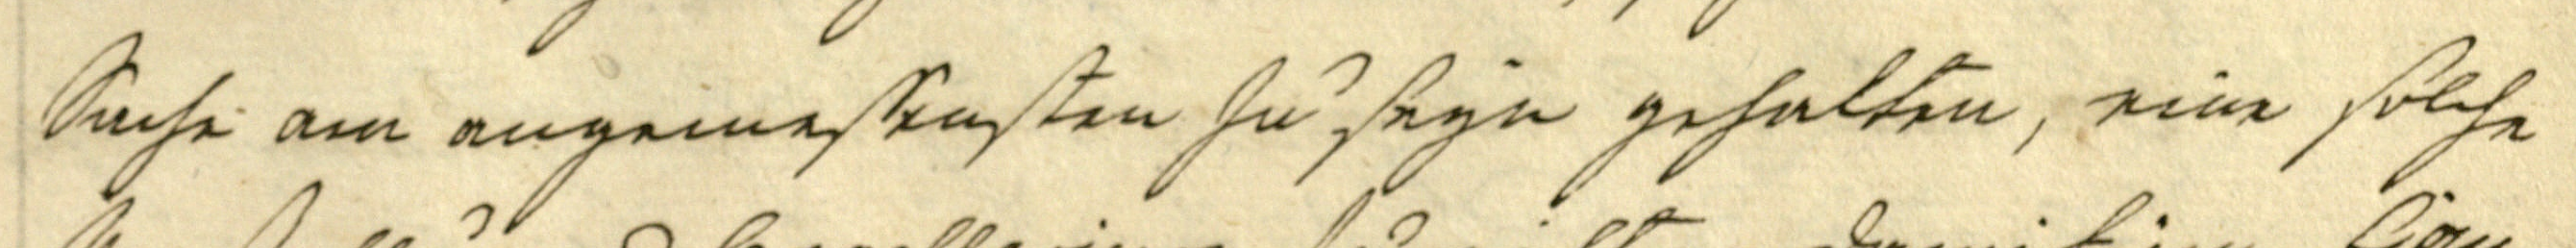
Sache am angemessensten zu seÿn gehalten, eine solche
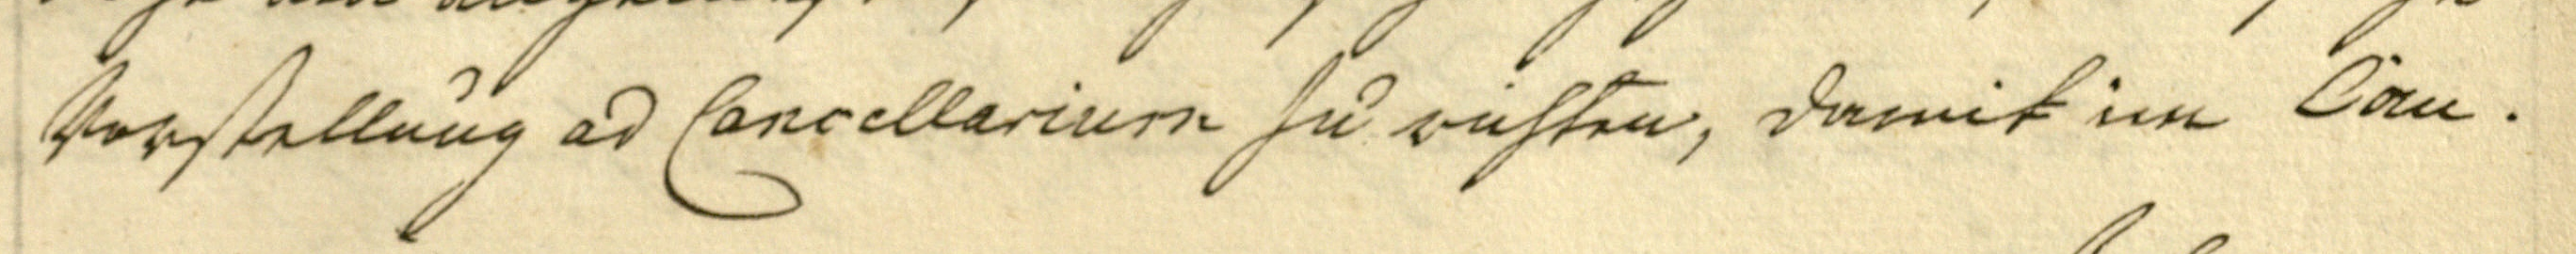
Vorstellung ad Cancellarium zu richten, damit im Can¬
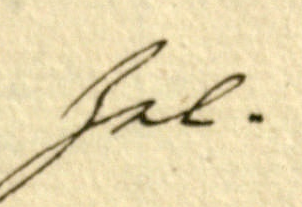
zel
